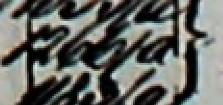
1266/a
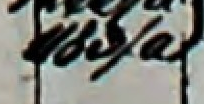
1185/a
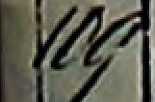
109
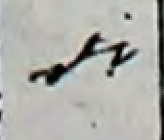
do
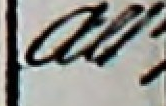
Alt
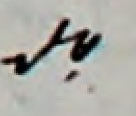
do
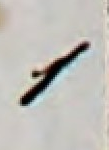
1
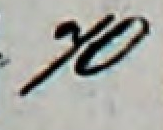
70
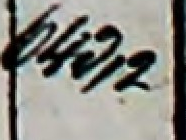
643,2
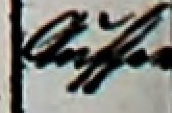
Aussee
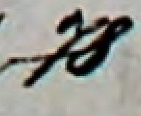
78
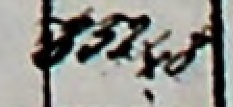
852,8
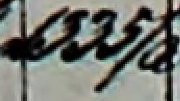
1335/a
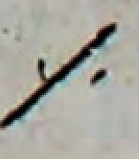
./.
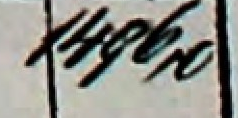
1496,0
